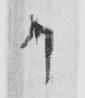人
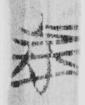者
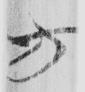方
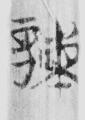諫
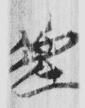𫊟
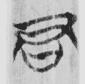君
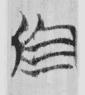於
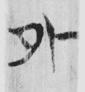外
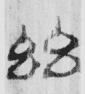𢆶
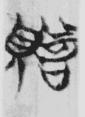{見八言}
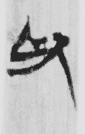父
